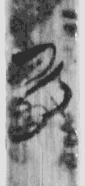敢
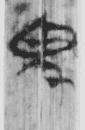鬼
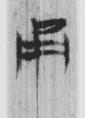甬
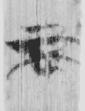不
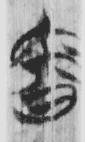審
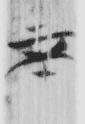不
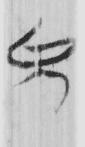允
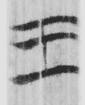王
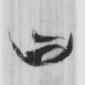曰
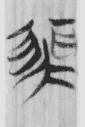{聑大}
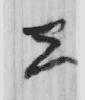巳
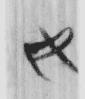女
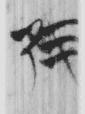隹
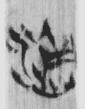{沈臼}
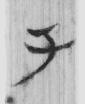子
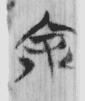余
